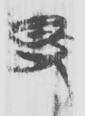𠭁
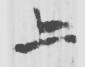上
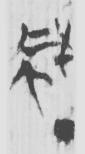風
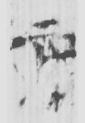下
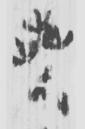芔
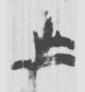上
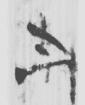之
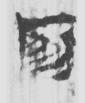所
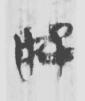好
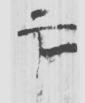下
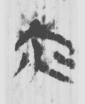亦
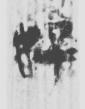好
